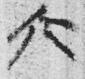六
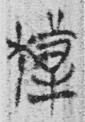○（幹）
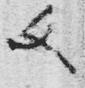父
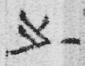之
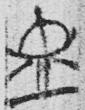蛊（蠱）
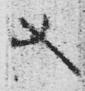又（有）
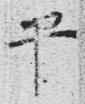子
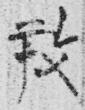攷
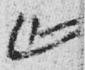亡（无）
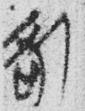咎
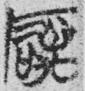○（厲）
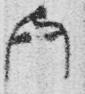夂（終）
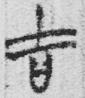吉
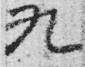九
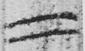二
